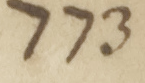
773
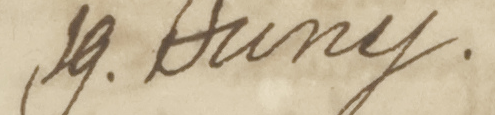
19. Juny.
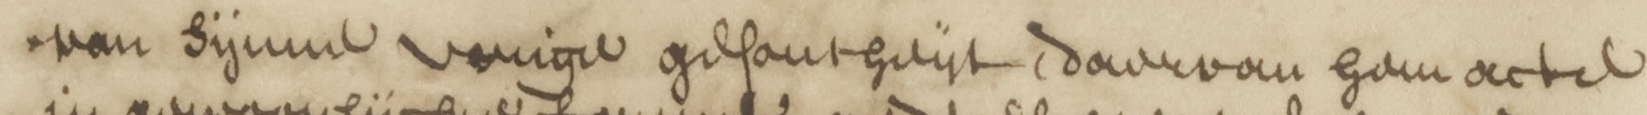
van sijnne vorige gesontheijt, daervan hem acte
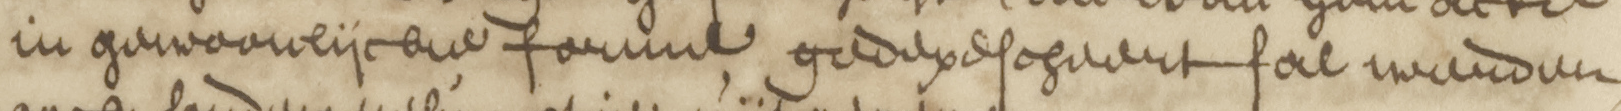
in gewoonlijcke forme gedepescheert sal werden,
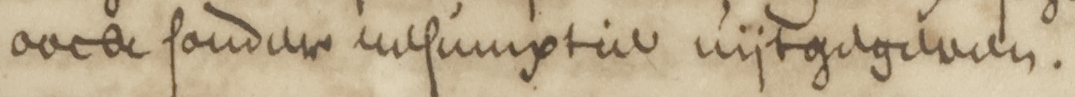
oock sonder resumptie uijtgegeven.
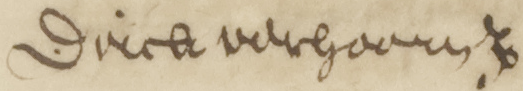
Dirck verhoorn @.
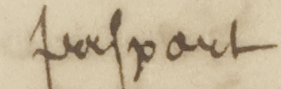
pasport
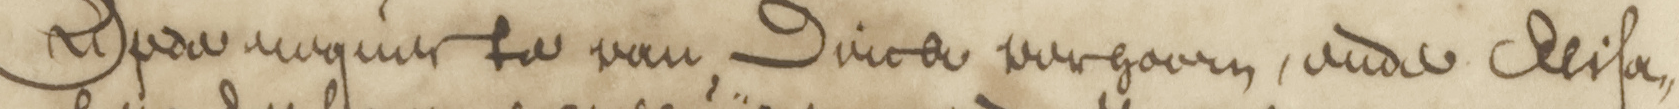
Opde requeste van Dirck verhoorn, ende Elisa„
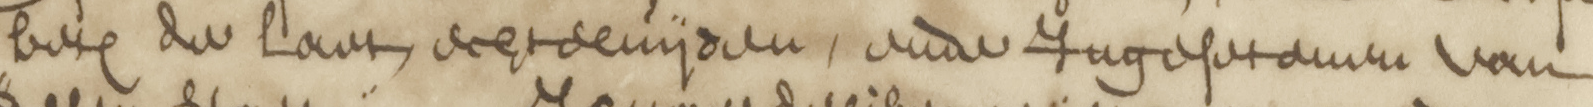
„beth de laet, echteluijden, ende Ingesetenen van
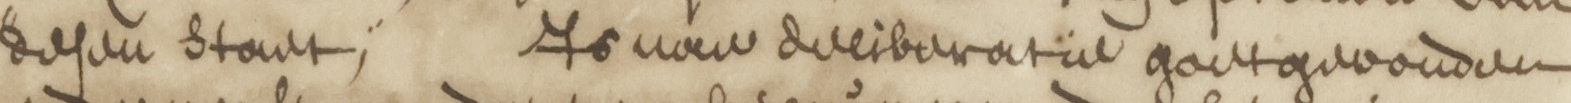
desen Staet; Is nae deliberatie goetgevonden
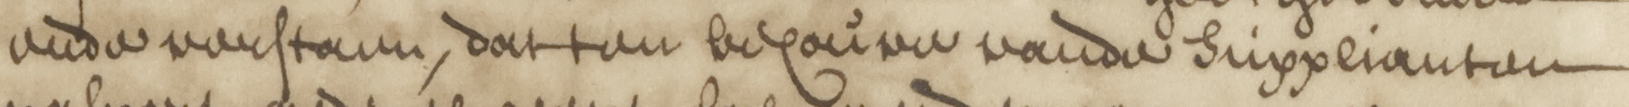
ende verstaen, dat ten behouve vande Supplianten
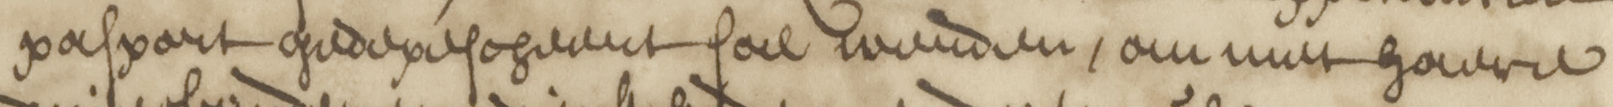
pasport gedepescheert sal werden, om met haere
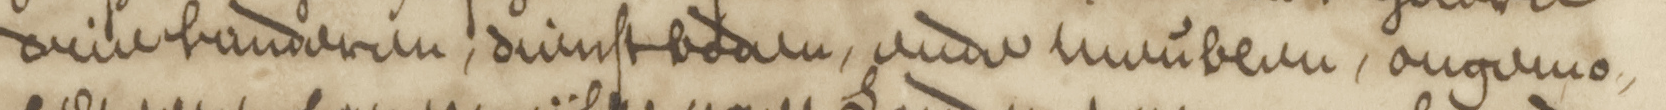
drie kinderen, dienstboden, ende meublen, ongemo„
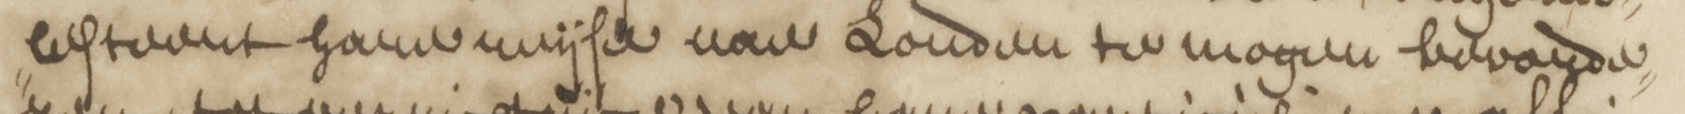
„lesteert hare reijse nae Londen te mogen bevorde„
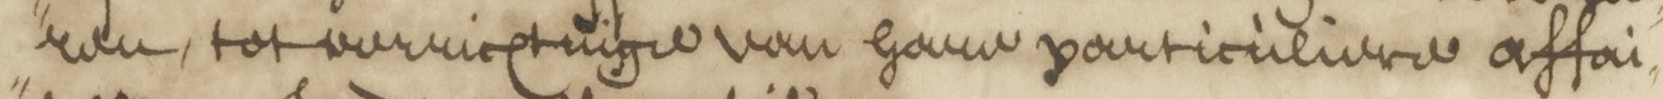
„ren, tot verrichtinge van hare particuliere affai„
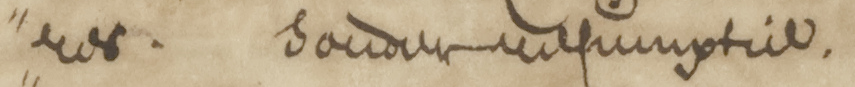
„res. sonder resumptie.
